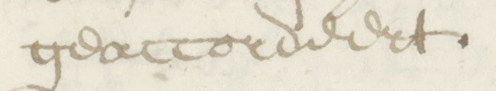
geaccordeert.
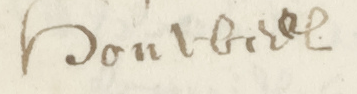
Houweel
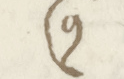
ca
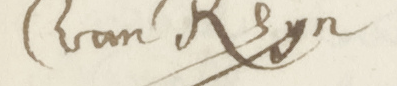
van Reijn
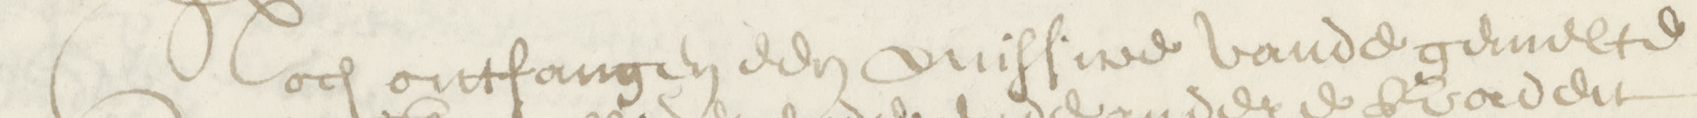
Noch ontfangen een missive vande gemelte
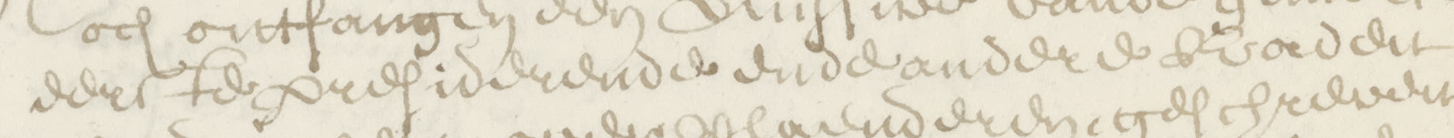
eerste presiderende ende andere Raden
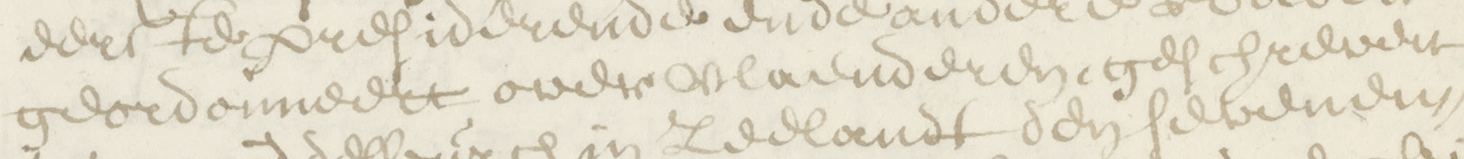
geordonneert over Vlaenderen, geschreven
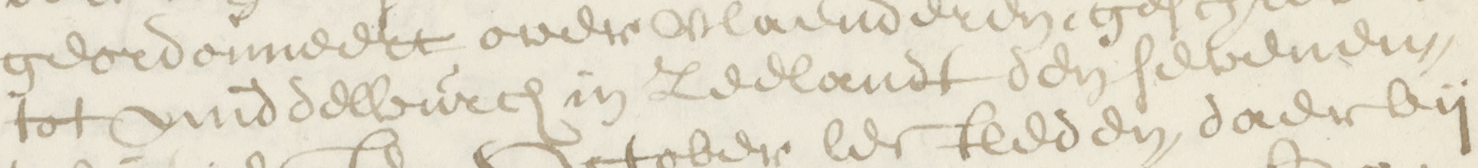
tot Middelburch in Zeelandt den sevenen„
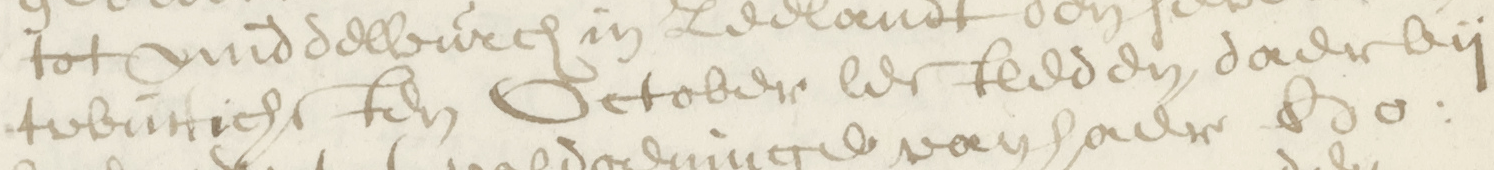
twinttichsten October lestleden, daerbij
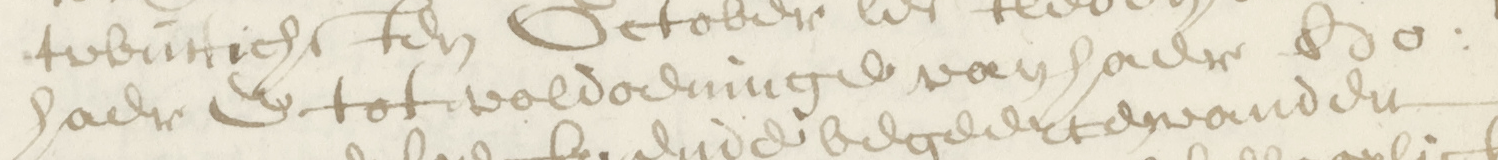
haer E. totvoldoeninge van haer Ho:
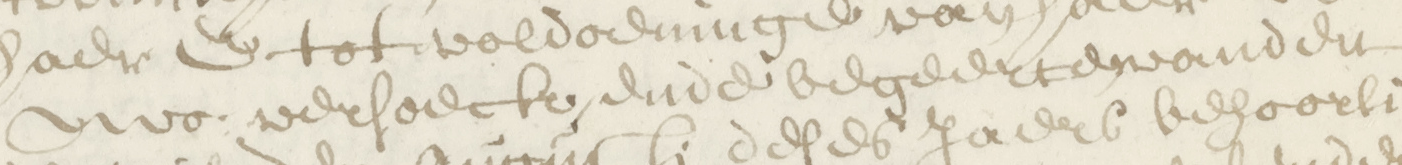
Mo: versoeck, ende begeerte vanden
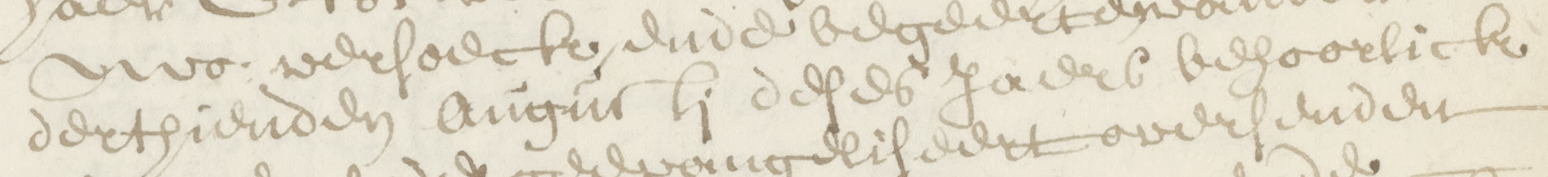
derthienden Augusti deses Jaers behoorlick
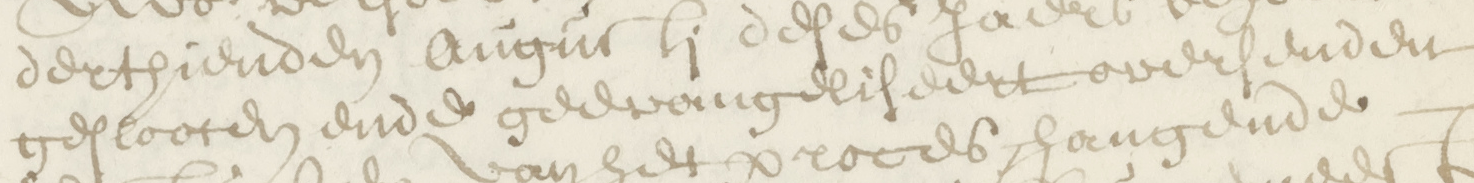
geslooten ende geevangeliseert oversenden
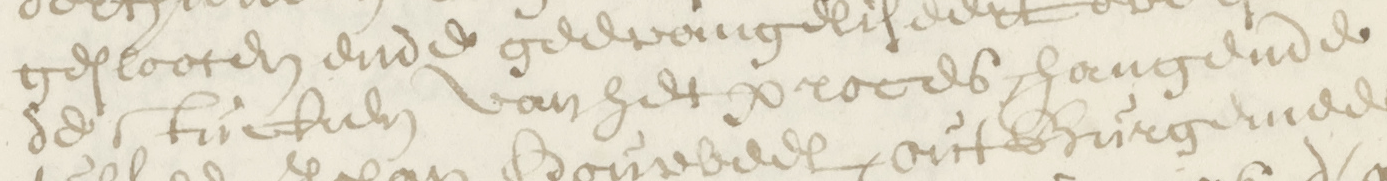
de stucken van het proces, hangende
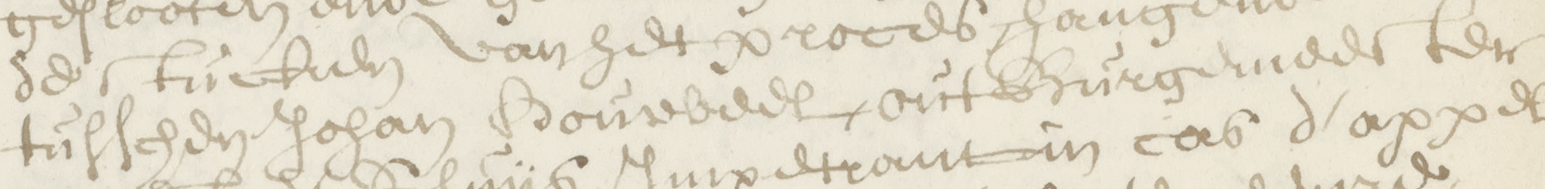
tusschen Johan Houweel, out Burgemeester
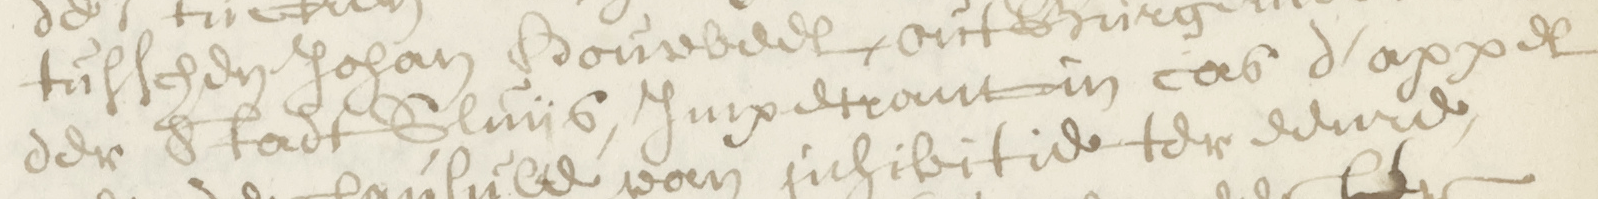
der stadt Sluijs, Impetrant in cas d'appel
